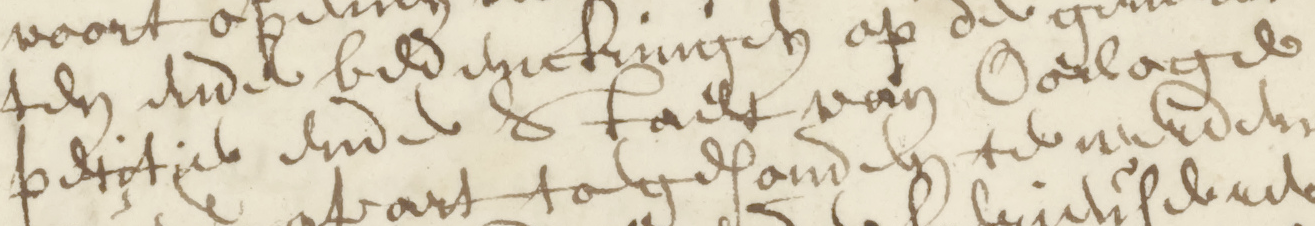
petitie ende Staet van Oorloge
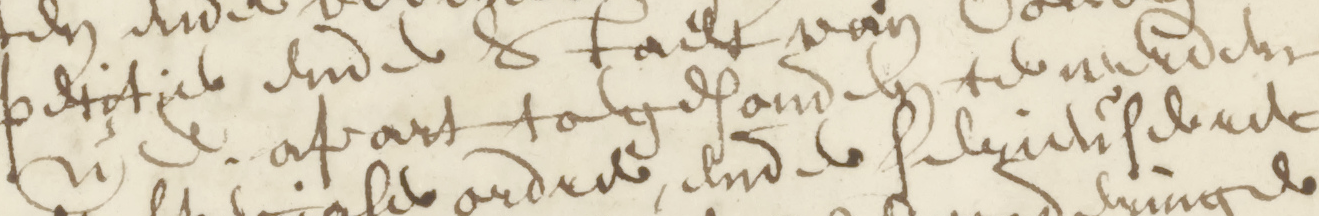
U E. apart toegesonden te werden,
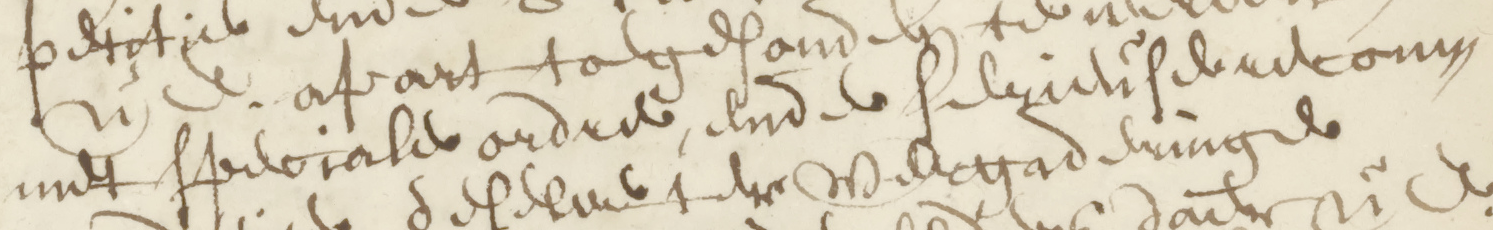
met speciale ordre, ende serieuse recom„
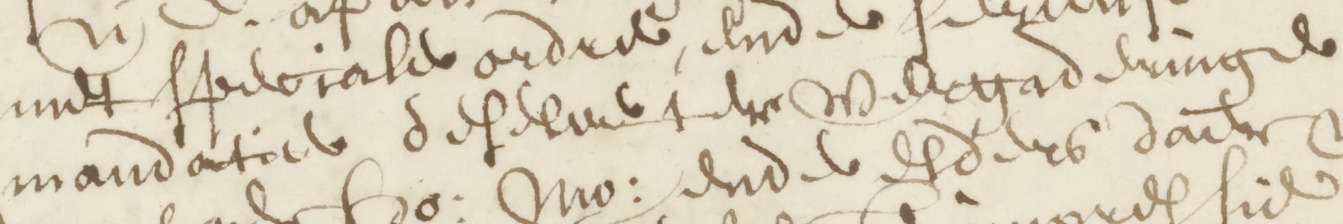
mandatie deselve ter Vergaderinge
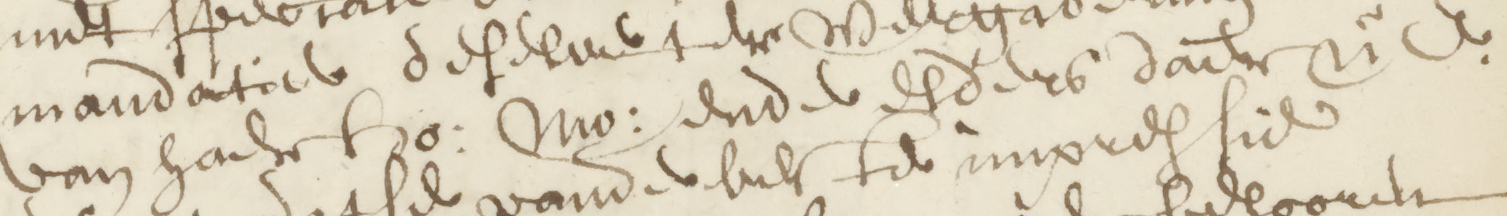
van haer Ho:Mo: ende elders daer U E.
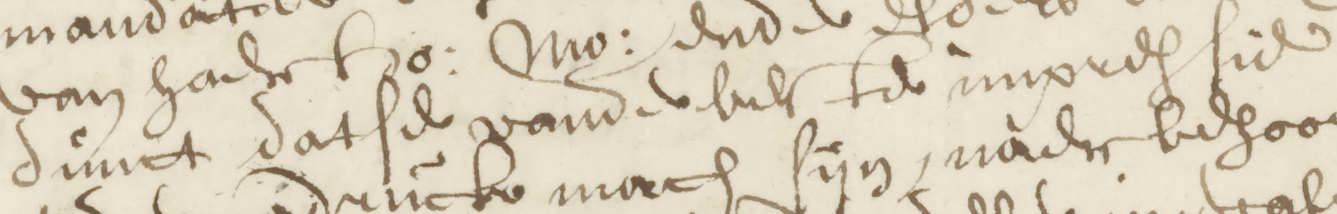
dunct datse vande beste impressie
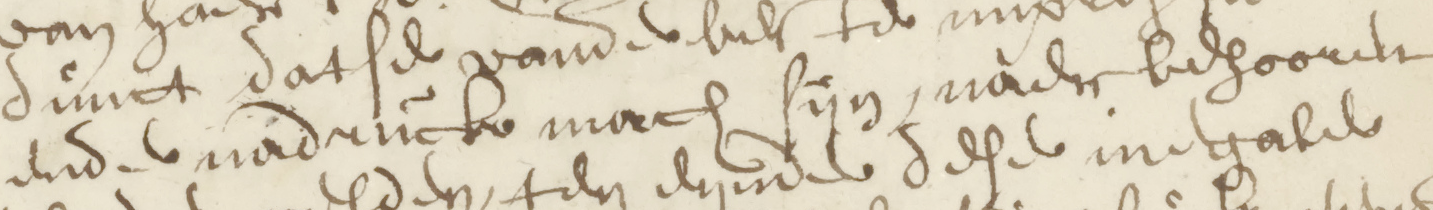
ende nadruck mach sijn, naer behooren
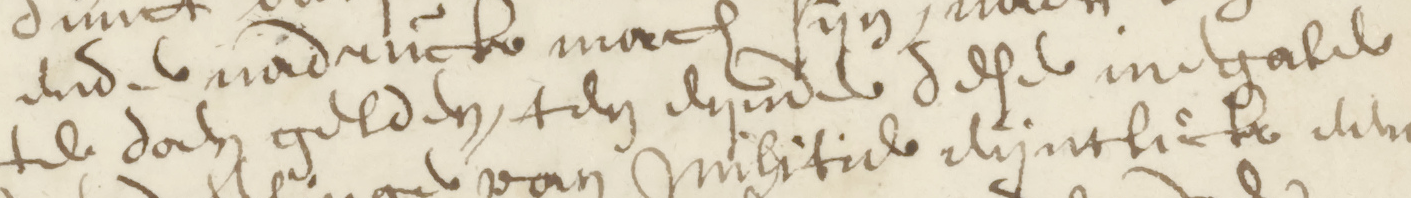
te doen gelden, ten eijnde dese inegale
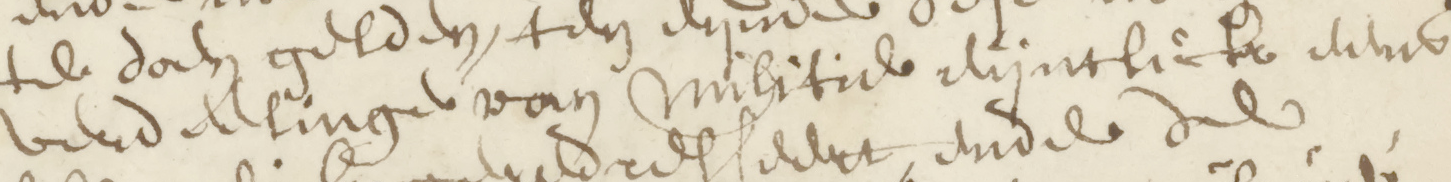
verdeelinge van Militie eijntlick eens
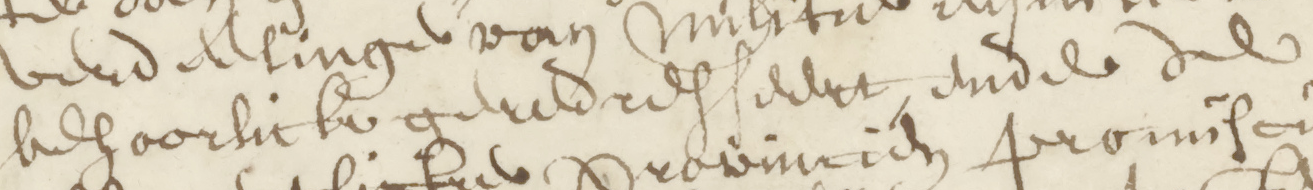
behoorlick geredresseert, ende de
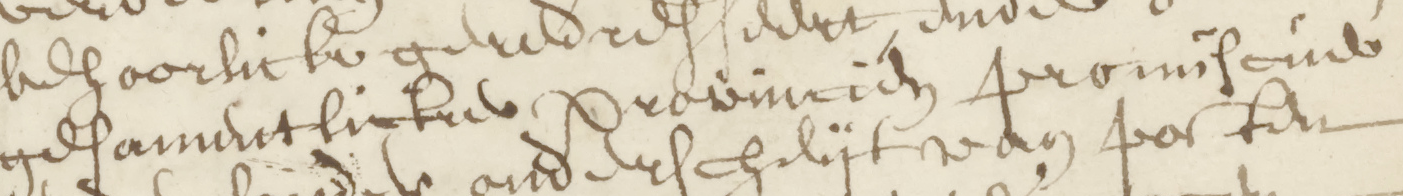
gesamentlicke Provincien promiscue
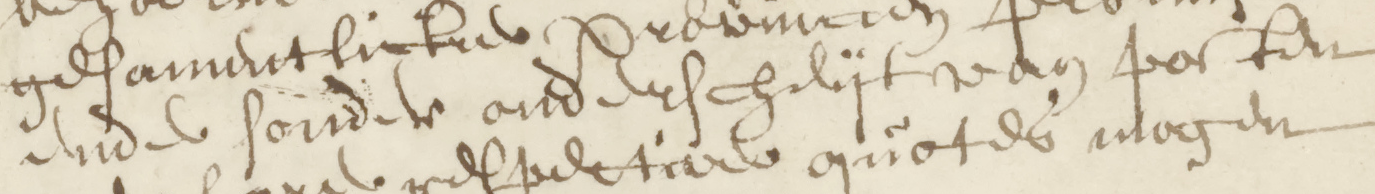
ende sonder onderscheijt van posten
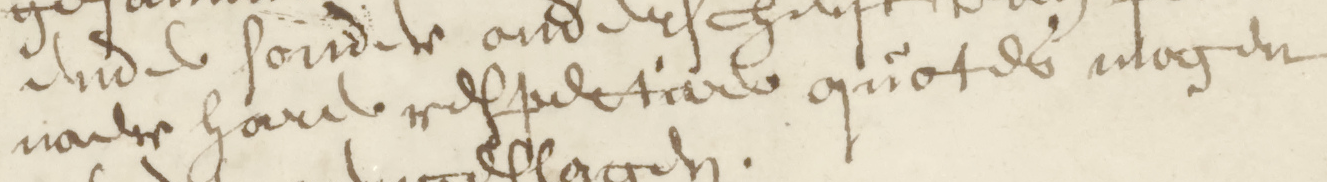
naer hare respective quotes mogen
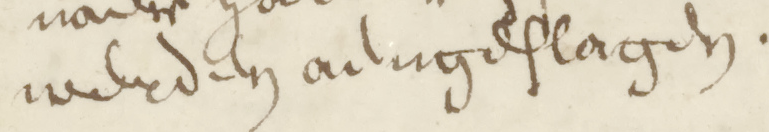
werden aengeslagen.
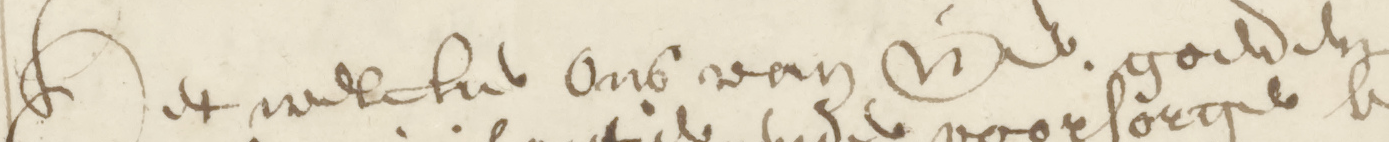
Het welcke ons van U E. goeden
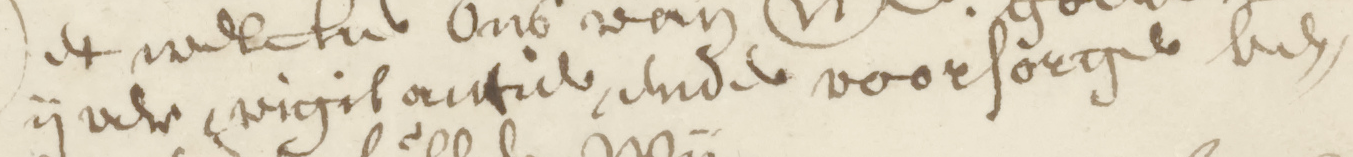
ijver, vigilantie, ende voorsorge be„
